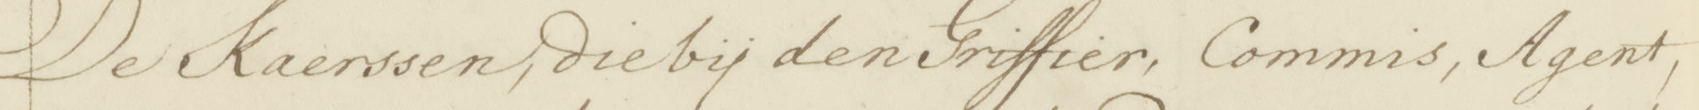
De Kaerssen, die bij den Griffier, Commis, Agent,
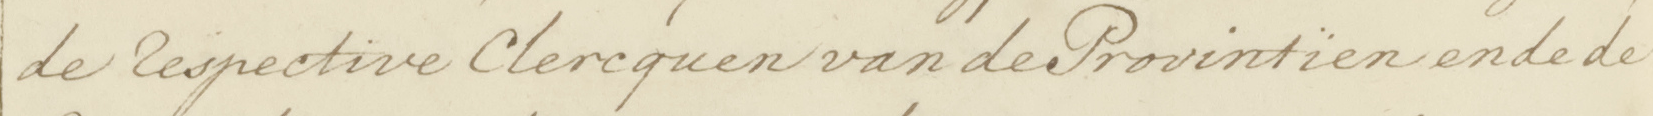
de Respective Clercquen van de Provintïen ende de
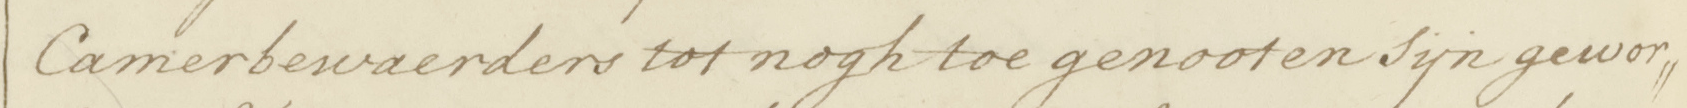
Camerbewaerders tot nogh toe genooten sijn gewor„
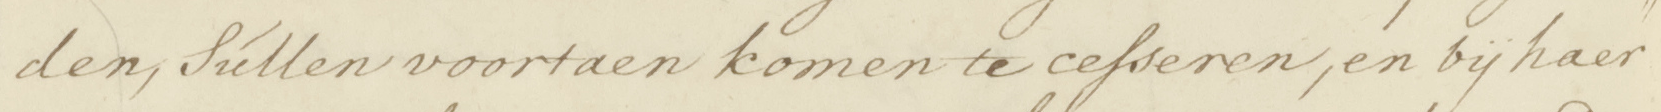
den, sullen voortaen komen te cesseren, en bij haer
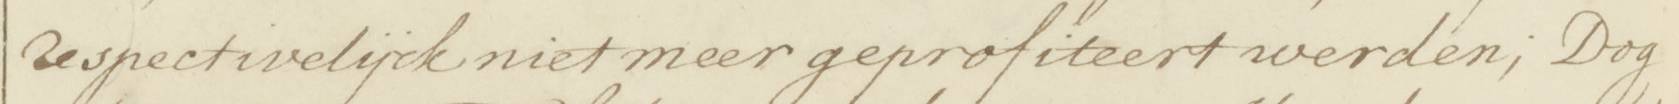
respectivelijck niet meer geprofiteert werden; Dog
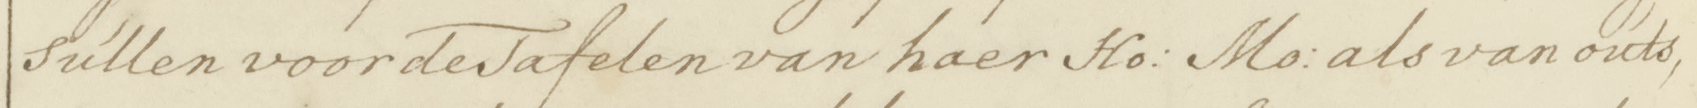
sullen voor de Tafelen van haer Ho:Mo: als van outs,
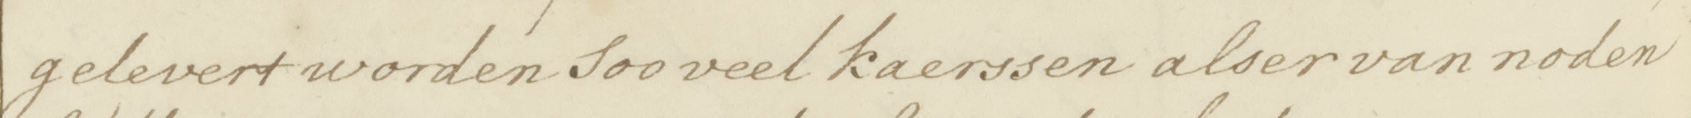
gelevert worden soo veel kaerssen alser van noden
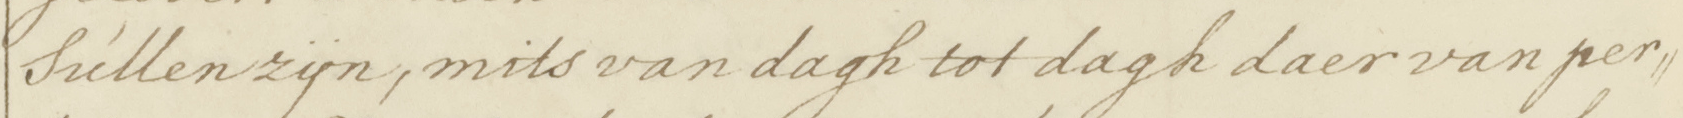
sullen zijn, mits van dagh tot dagh daer van per„
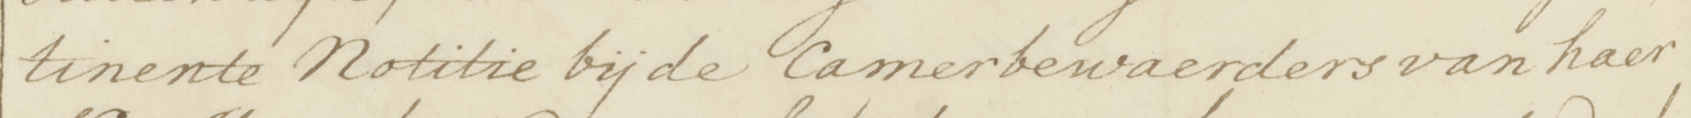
tinente Notitie bij de Camerbewaerders van haer
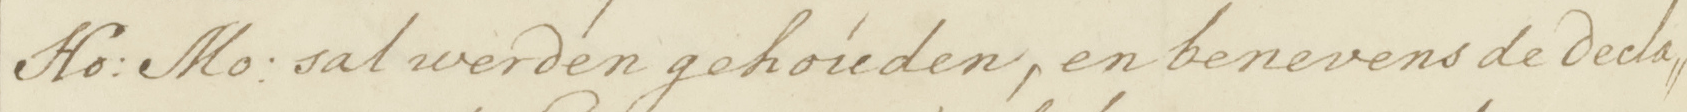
Ho:Mo: sal werden gehouden, en benevens de decla„
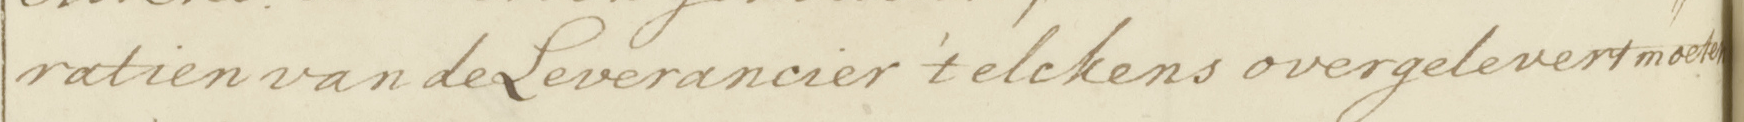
ratien van de Leverancier t‛elckens overgelevert moeten
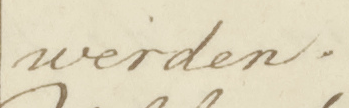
werden.
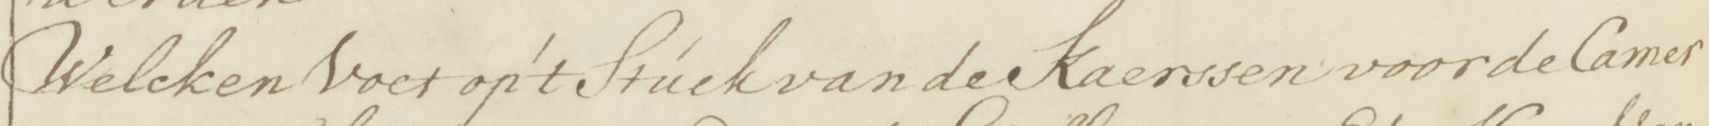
Welcken Voet op't Stuck van de Kaerssen voor de Camer
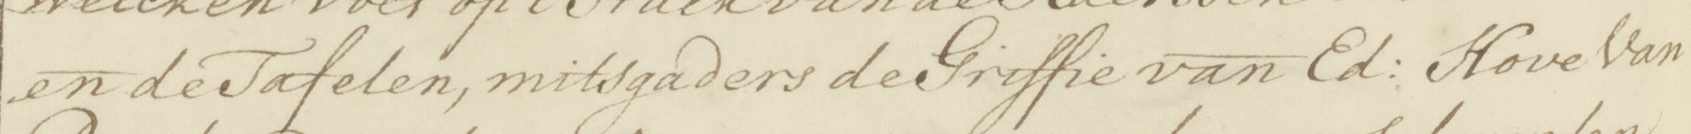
en de Tafelen, mitsgaders de Griffie van Ed: Hove Van
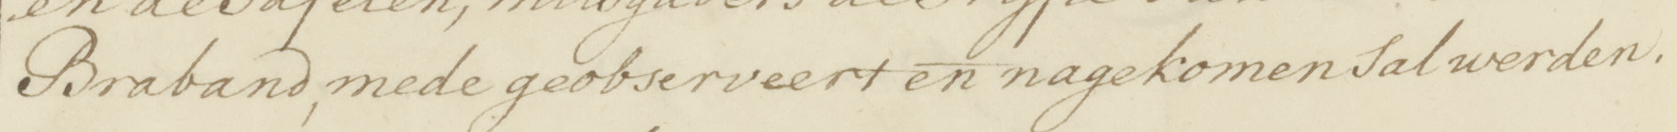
Braband, mede geobserveert en nagekomen sal werden.
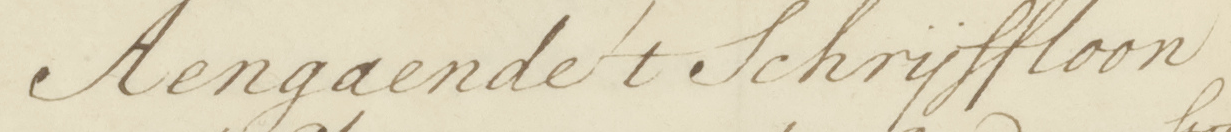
Aengaende ‛t Schrijffloon
